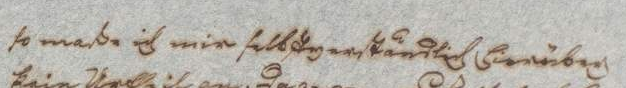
so maße ich mir selbstverständlich hierüber
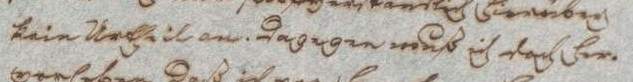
kein Urtheil an. Dagegen muß ich doch her-
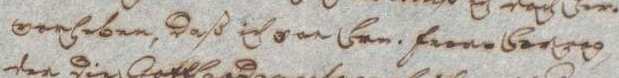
vorheben, daß ich vor Hrn. Feer-Herzog,
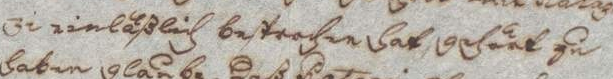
zi einläßlich besprochen hat, gehört zu
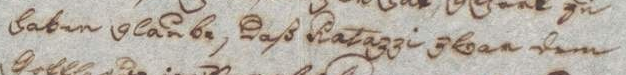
haben glaube, daß Ratazzi zwar dem
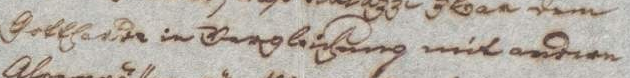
Gottharde in Vergleichung mit andern
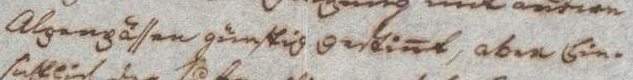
Alpenpässen günstig gestimmt, aber hin-
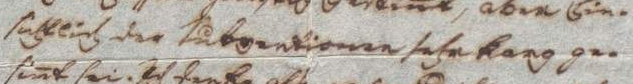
sichtlich der Subventionen sehr karg ge-
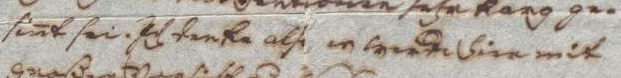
sinnt sei. Ich denke also, es werde hier mit
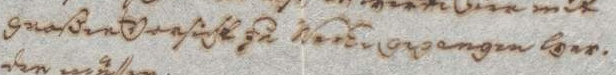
großer Vorsicht zu Werke gegangen wer-
